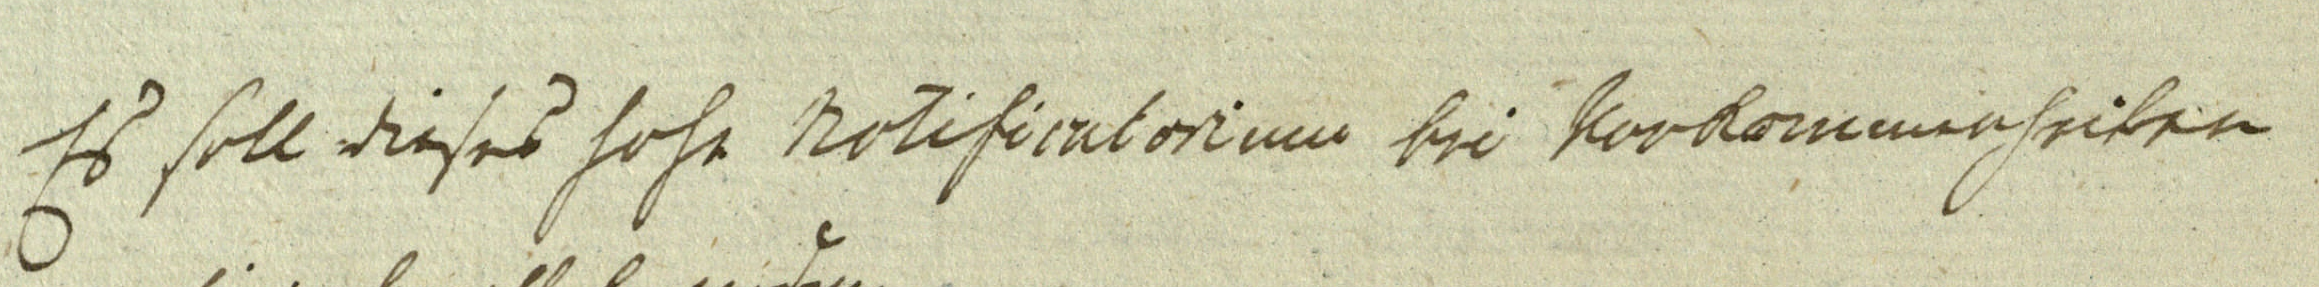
Es soll dieses hohe Notificatorium bei Vorkommenheiten
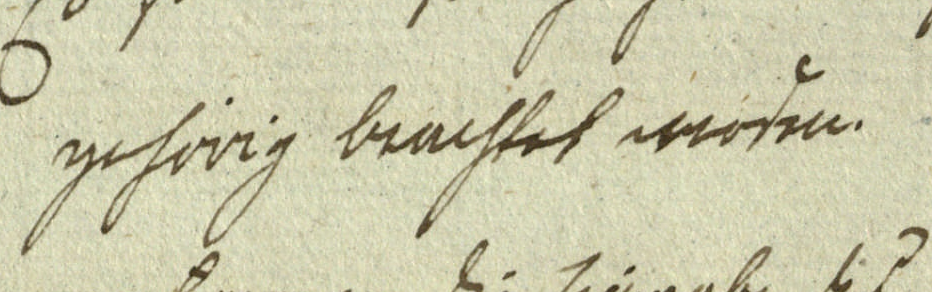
gehörig beachtet werden.
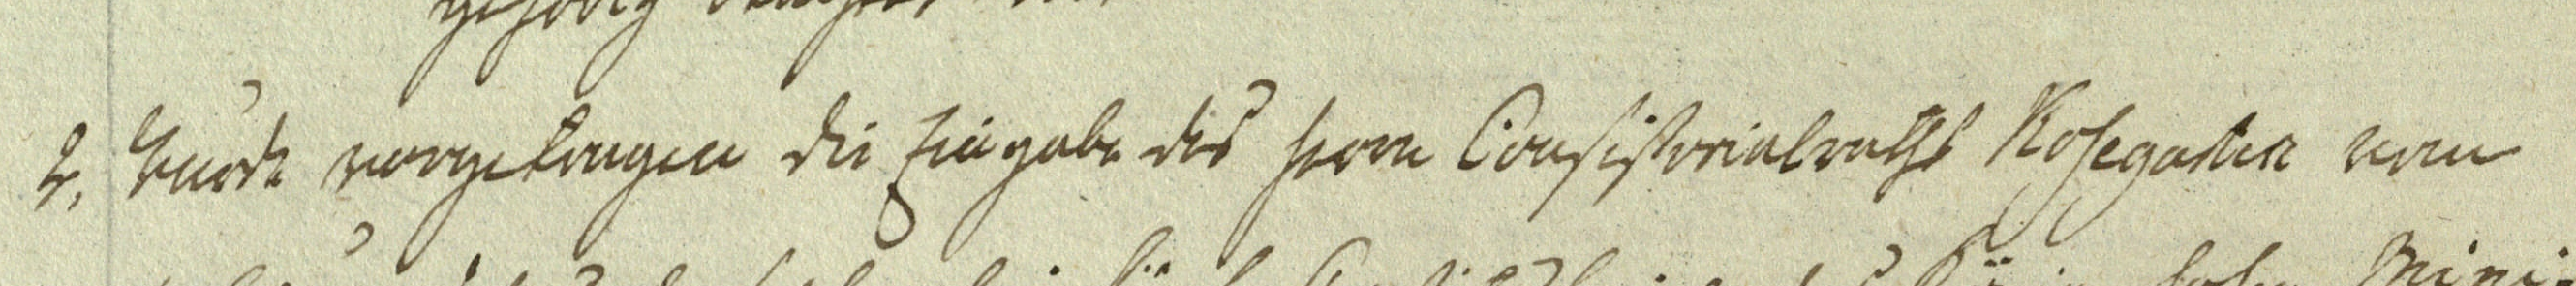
2, Wurde vorgetragen die Eingabe des Herrn Consistorialraths Kosegarten vom
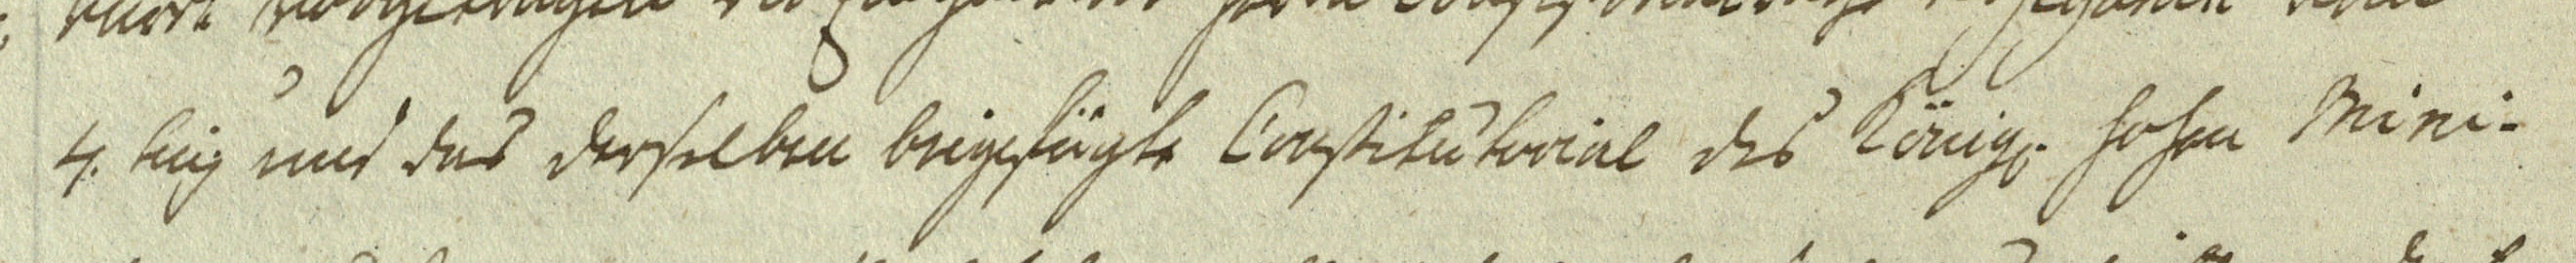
4. huj. und das derselben beigefügte Constitutorial des Königl. hohen Mini¬
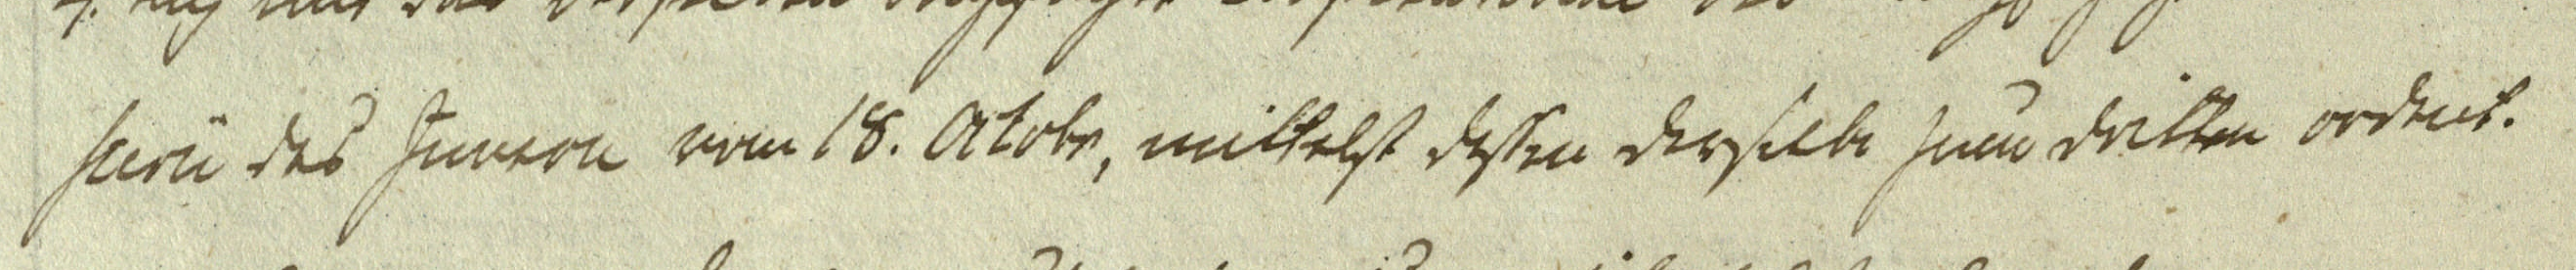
sterii des Innern vom 18. Octobr, mittelst dessen derselbe zum dritten ordent¬
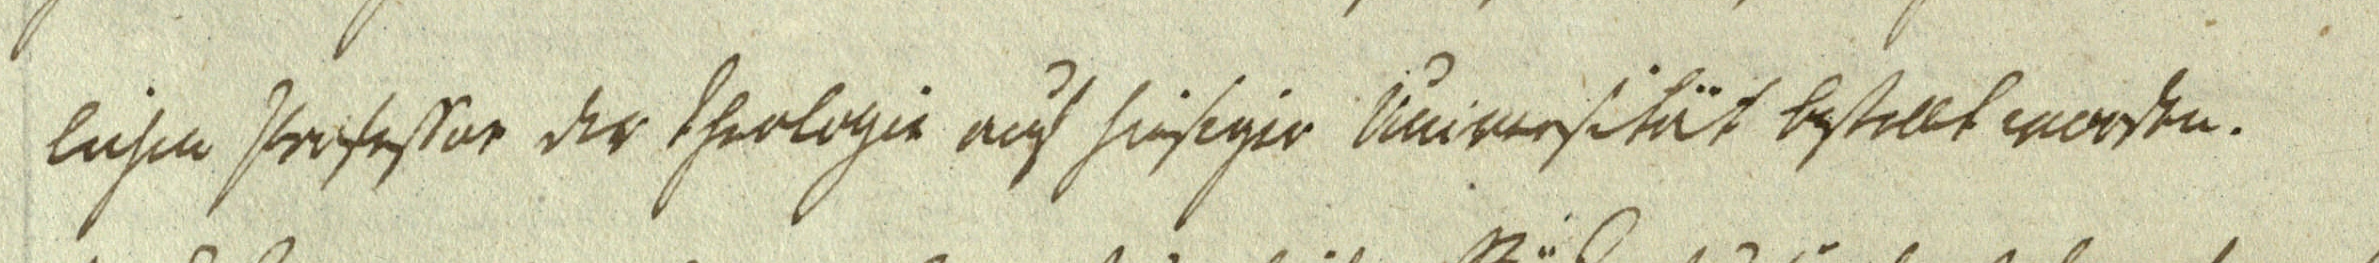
lichen Professor der Theologie auf hiesiger Universität bestellt worden.
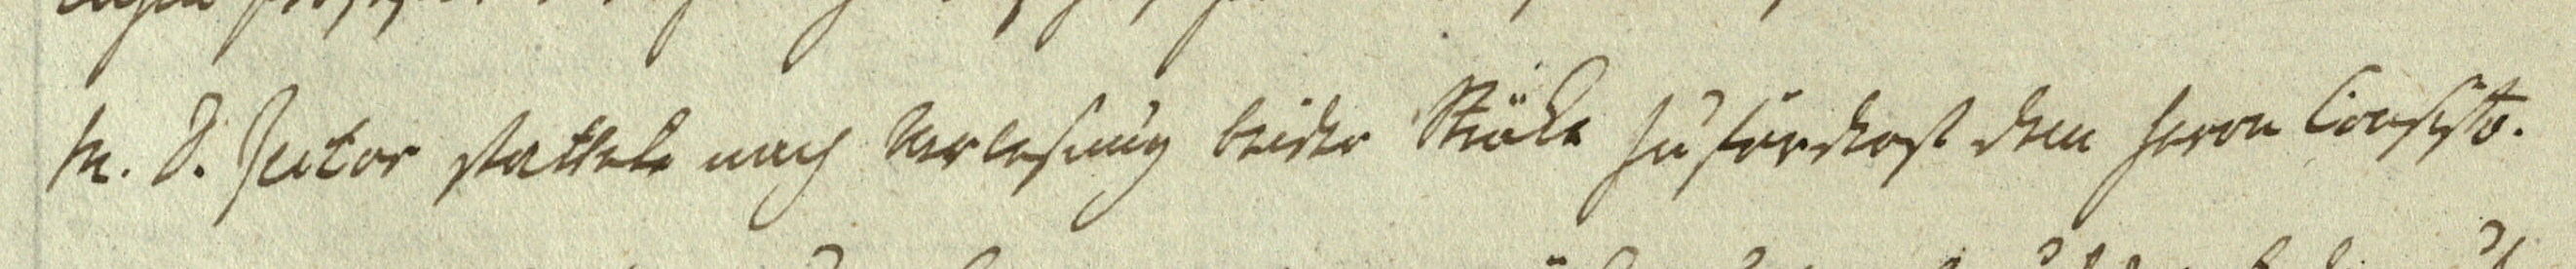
M. D. Rector stattete nach Verlesung beider Stücke zuförderst dem Herrn Consisto¬
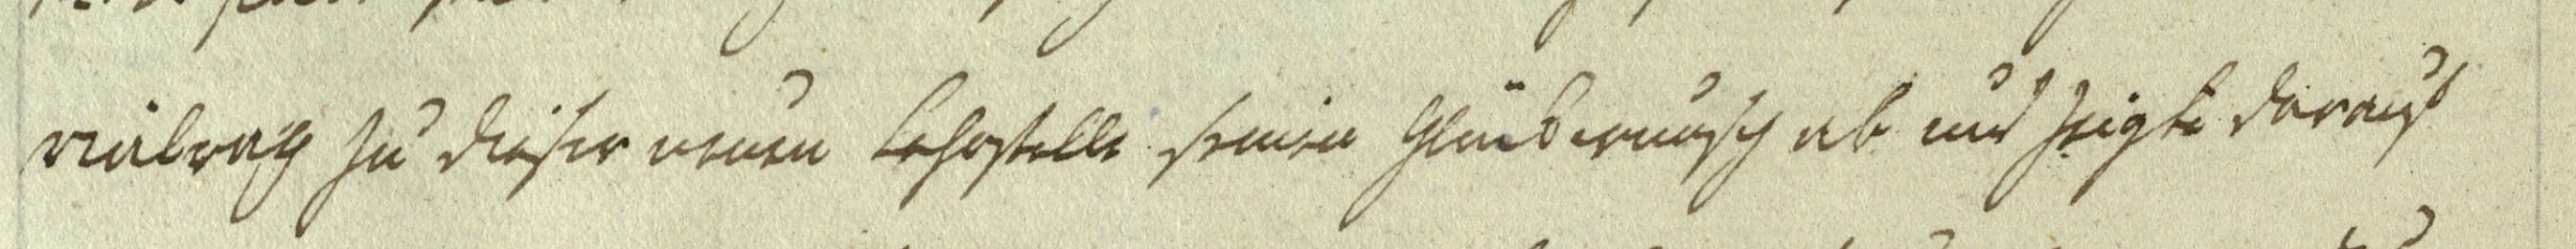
rialrath zu dieser neuen Lehrstelle seinen Glückwunsch ab und zeigte darauf
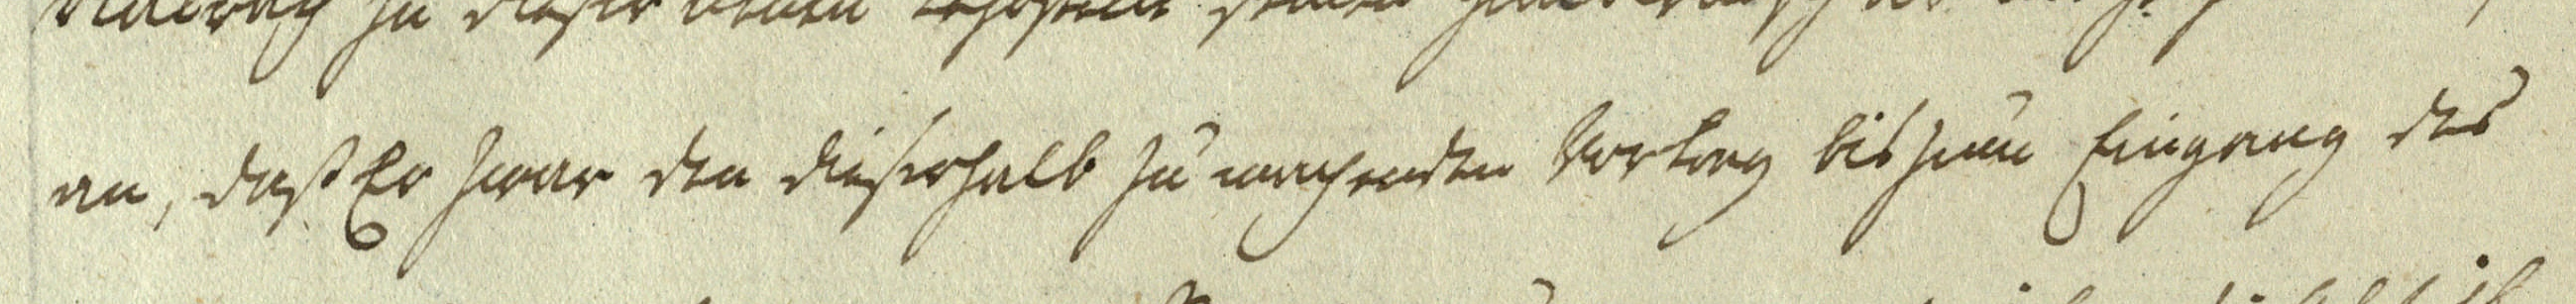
an, daß Er zwar den dieserhalb zu machenden Vortrag bis zum Eingang des
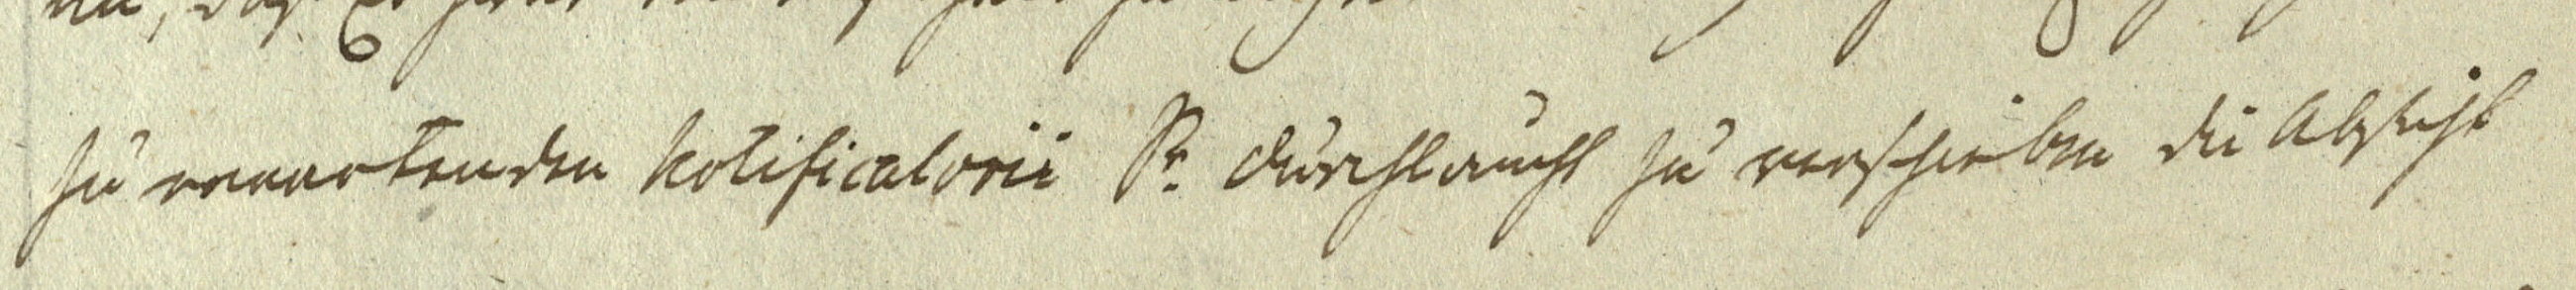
zu erwartenden Notificatorii Sr Durchlaucht zu verschieben die Absicht
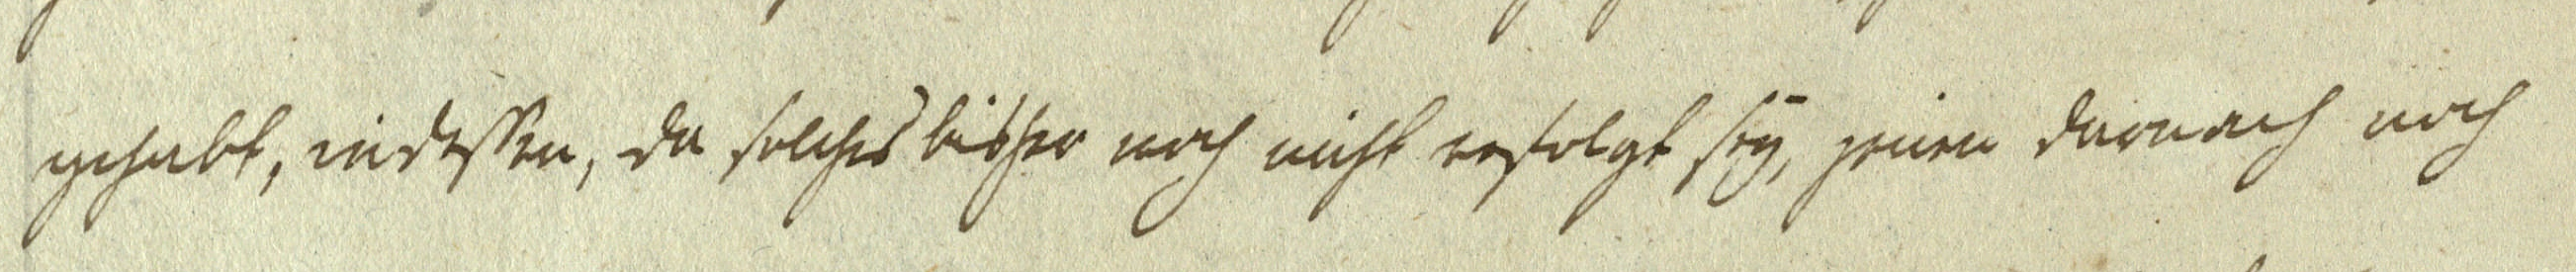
gehabt, indessen, da solches bisher noch nicht erfolgt seÿ, jenen darnach noch
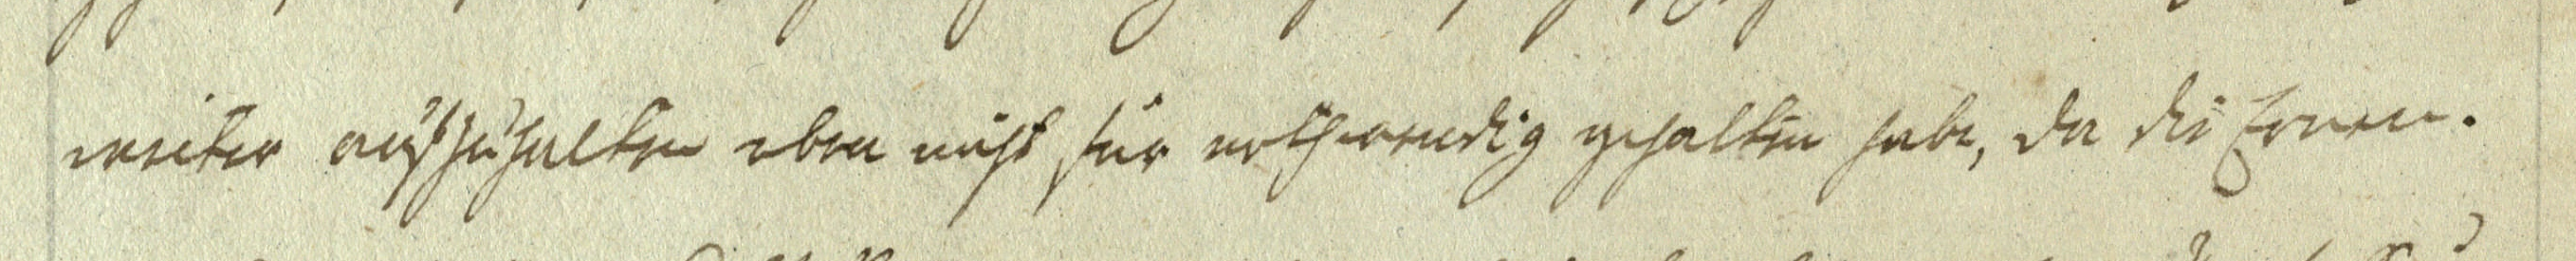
weiter aufzuhalten eben nicht für nothwendig gehalten habe, da die Ernen¬
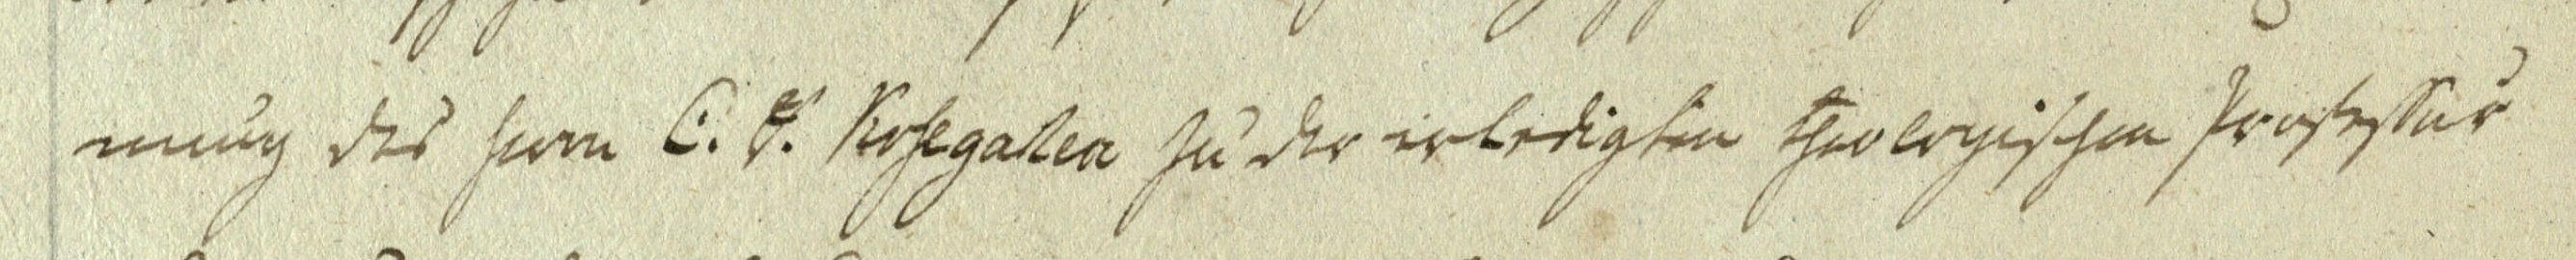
nung des herrn C. R. Kosegarten zu der erledigten theologischen Professur
